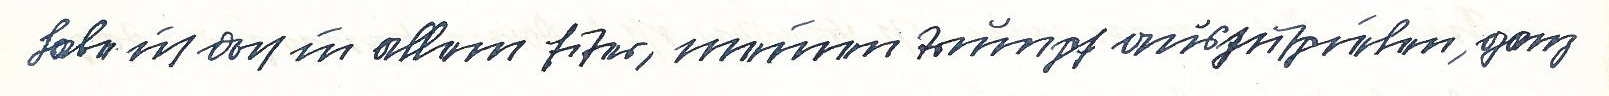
habe ich in allem Eifer, meinen Trumpf auszuspielen, ganz
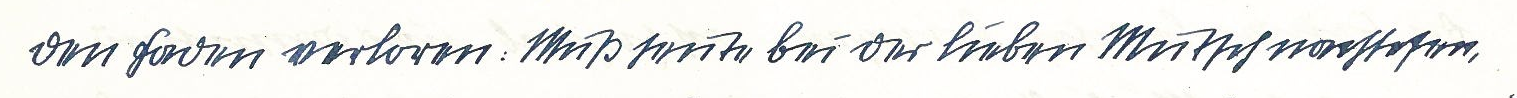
den Faden verloren: Muß heute bei der lieben Mutsch nachsehen,
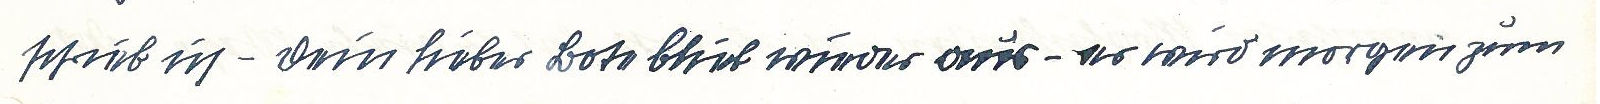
schrieb ich – Dein siebes Bote wieder aus – es wird morgen zum
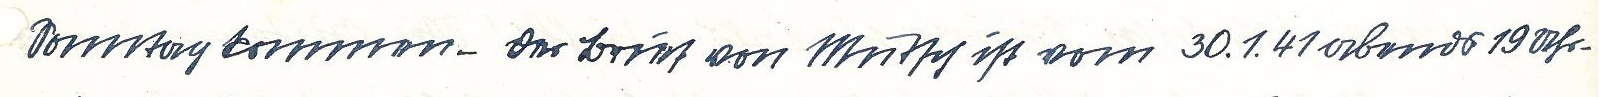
Sonntag kommen– der Brief ist vom 30.1.41 abends 19 Uhr.
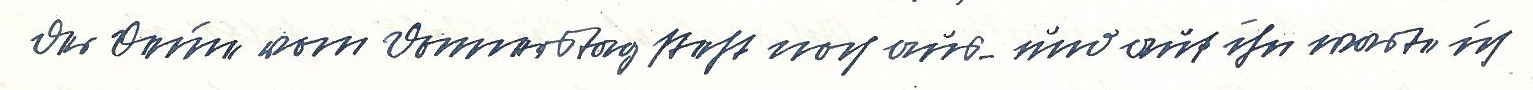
Der Deine vom Donnerstag steht noch aus – und auf ihn warte ich
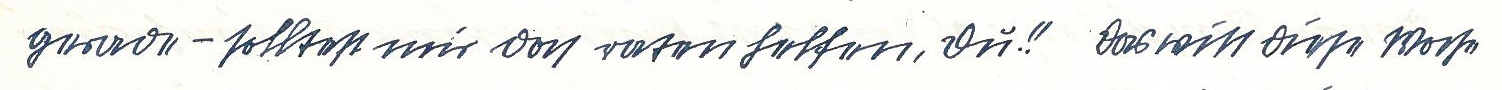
gerade – solltest mir doch raten helfen, Du!! Das will diese Woche
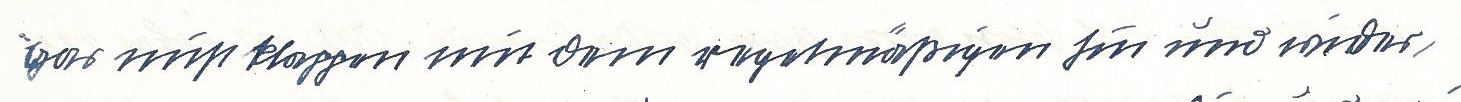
gar nicht klappen mit dem regelmäßigen hin und wieder,
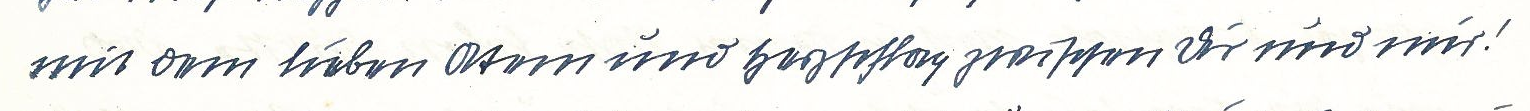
mit dem lieben Atem und Herzschlag zwischen Dir und mir!
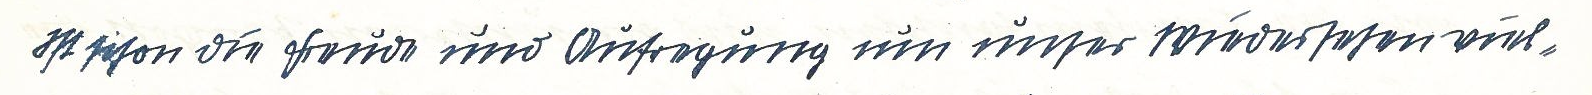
Ist schon die Freude und Aufregung um unser Wiedersehen viel¬
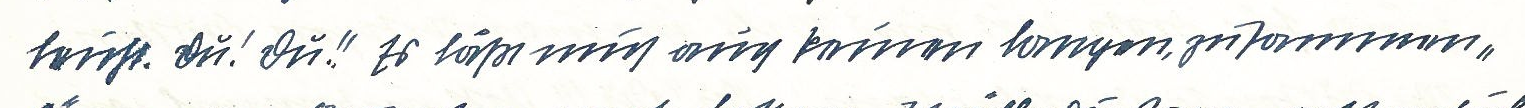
leicht, Du! Du!! Es läßt mich auch keinen langen, zusammmen¬
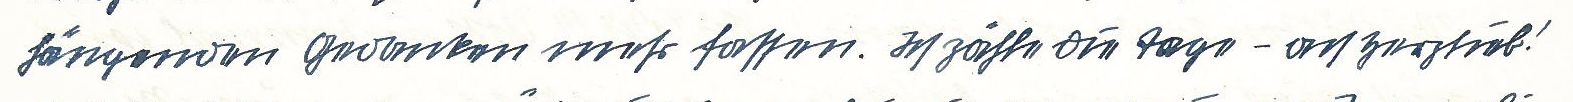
hängenden Gedanken mehr fassen. Ich zähle die Tage – ach Herzlieb!
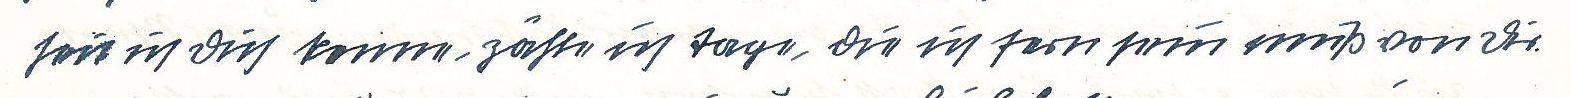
seit ich Dich kenne, zähle ich die Tage, die ich fern sein muß von Dir.
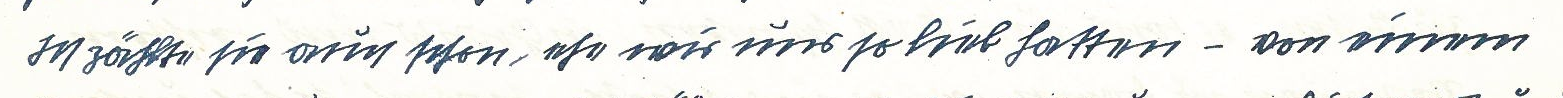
Ich zählte sie auch schon, ehe wir uns so lieb hatten – von einem
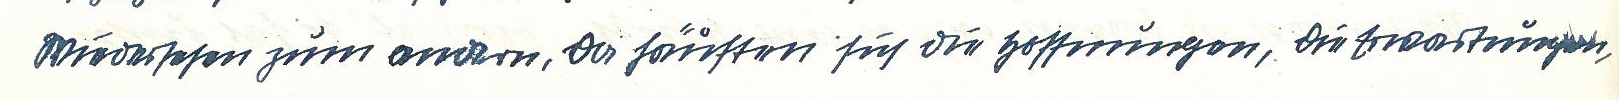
Wiedersehen zum andern, da häuften sich die Hoffnungen, die Erwartungen,
